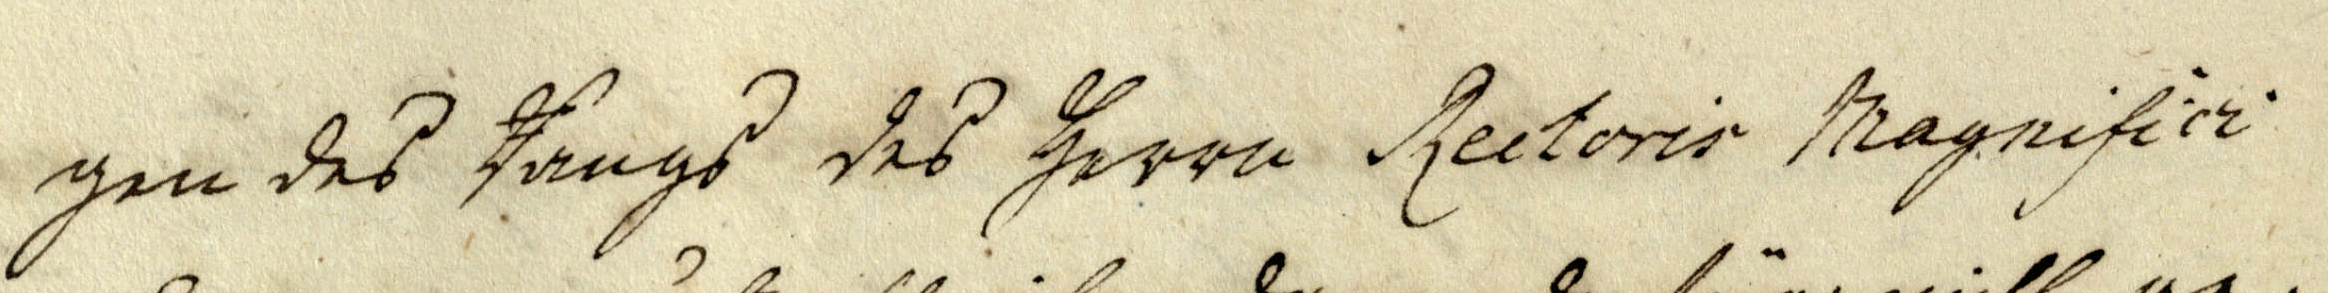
gen des Rangs des Herrn Rectoris Magnifici
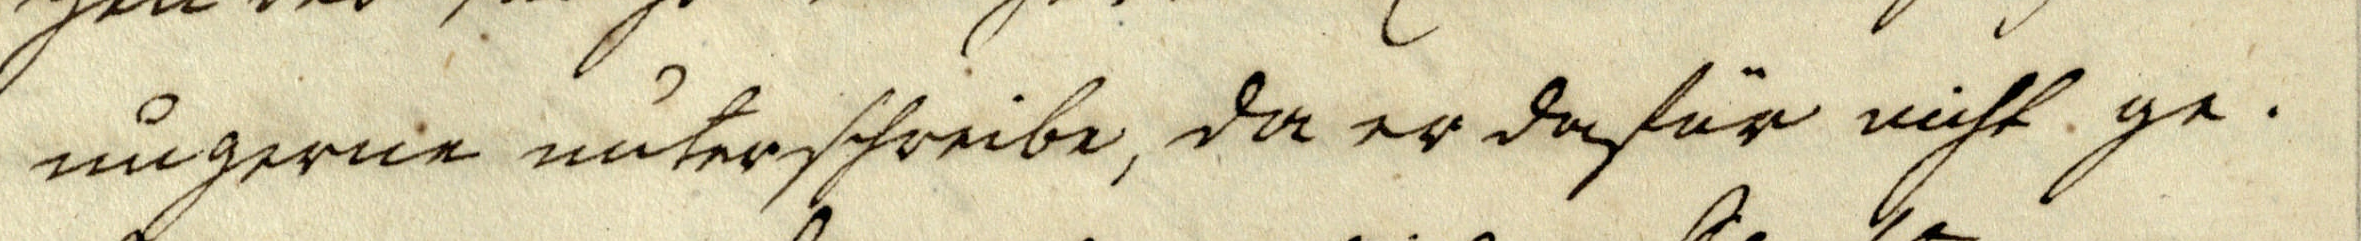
ungerne unterschreibe, da er dafür nicht ge¬
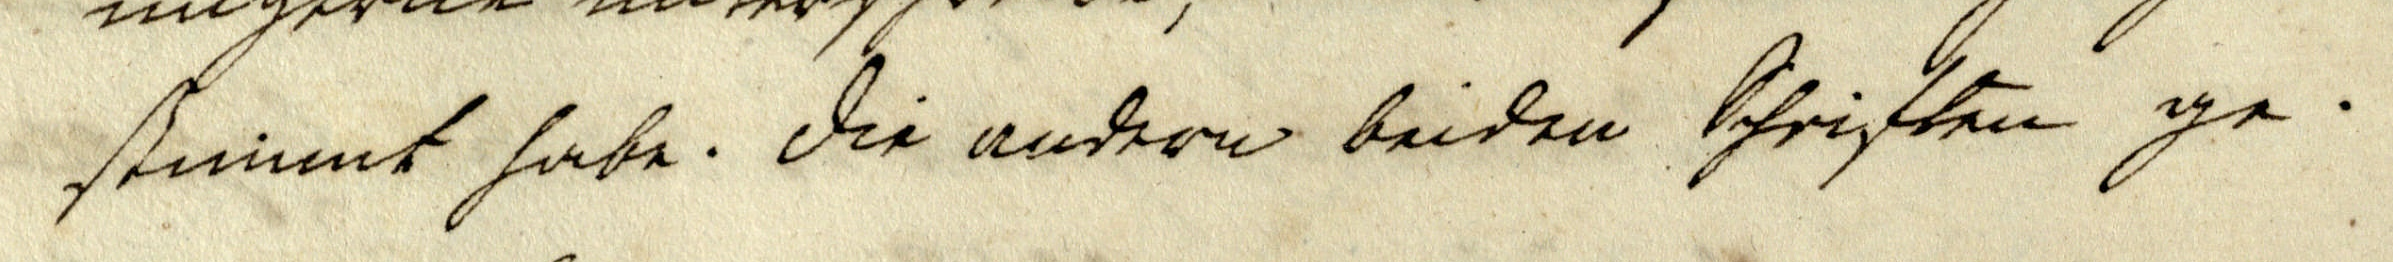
stimmt habe. Die andern beiden Schriften ge¬
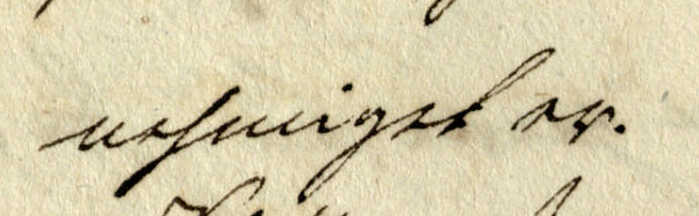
nehmiget er.
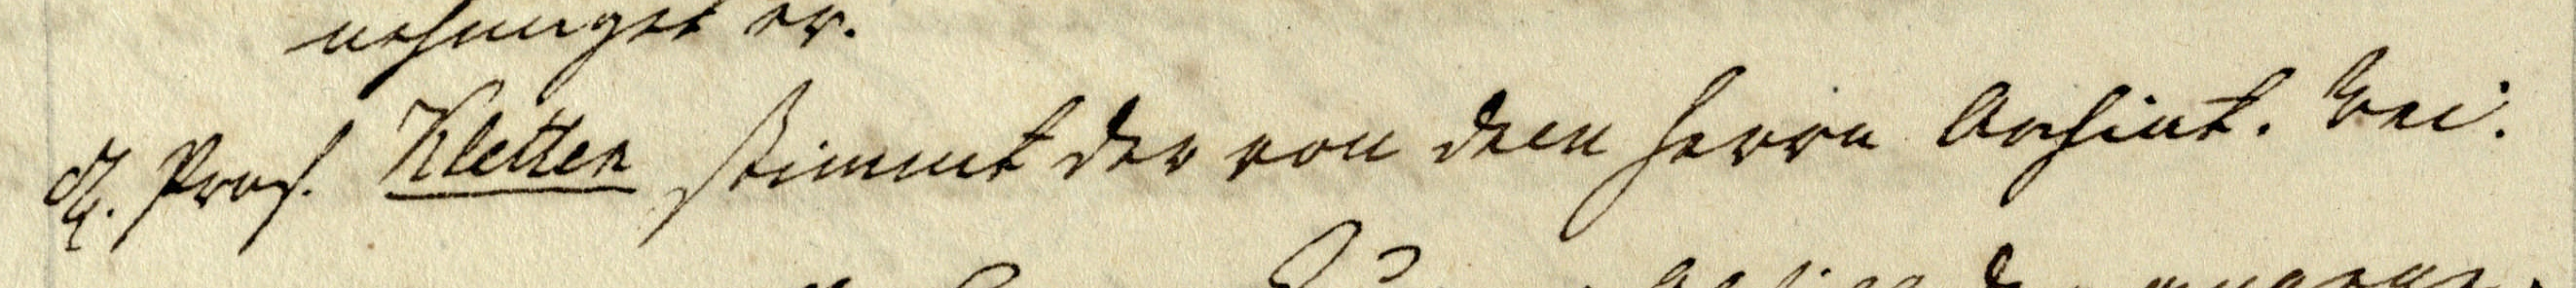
dh. Prof. Kletten stimmt der von dem Herrn Archiat. Wei¬
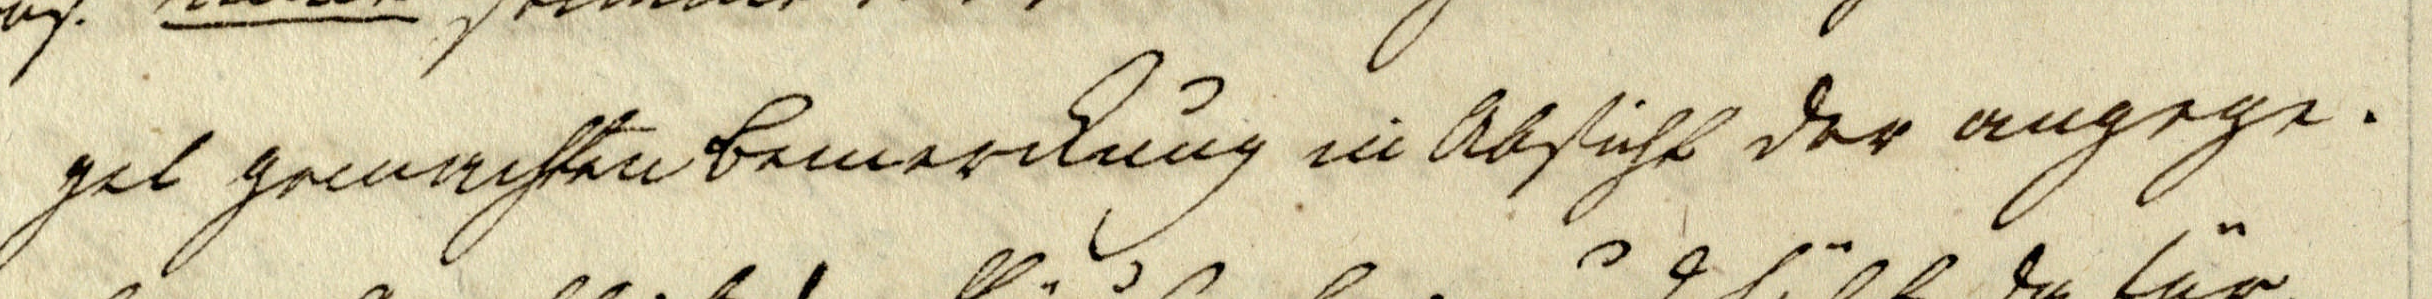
gel gemachten Bemerckung in Absicht der angege¬
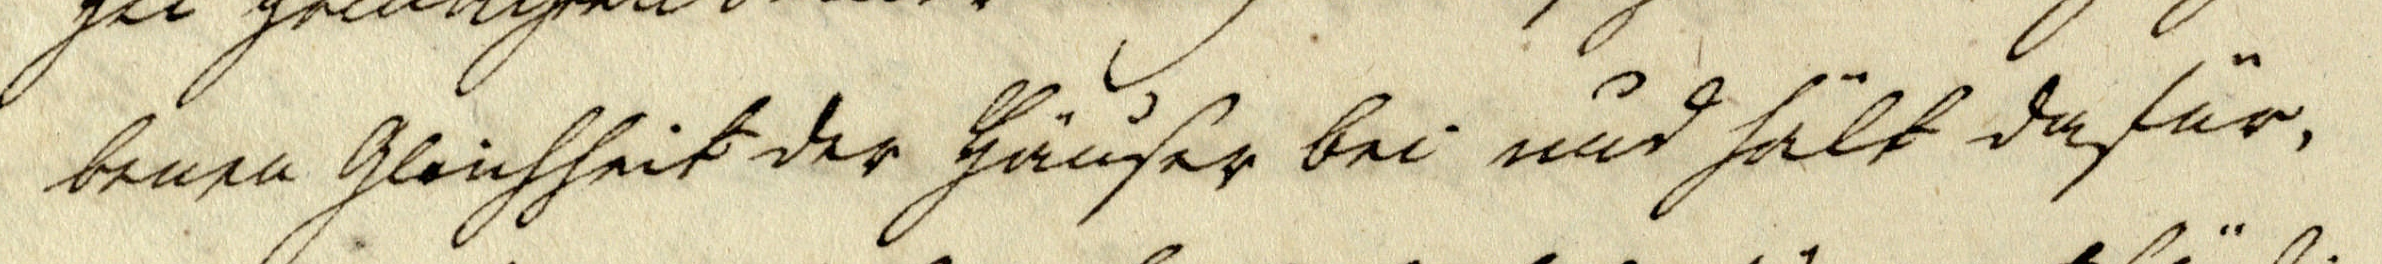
benen Gleichheit der Häuser bei und hält dafür,
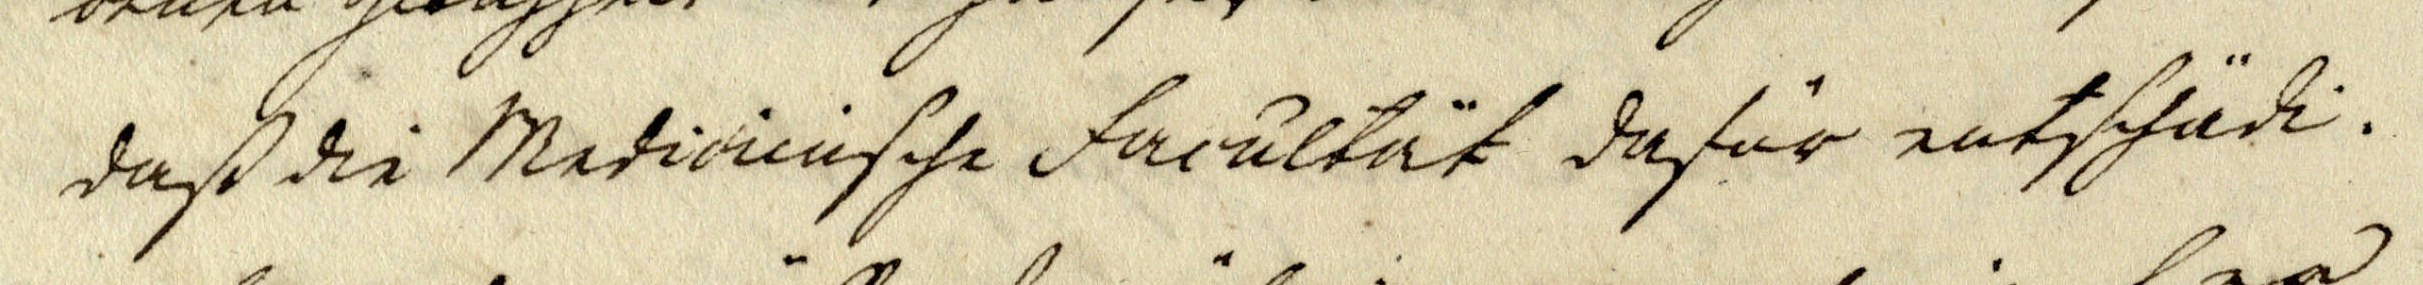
daß die Medicinische Facultät dafür entschädi¬
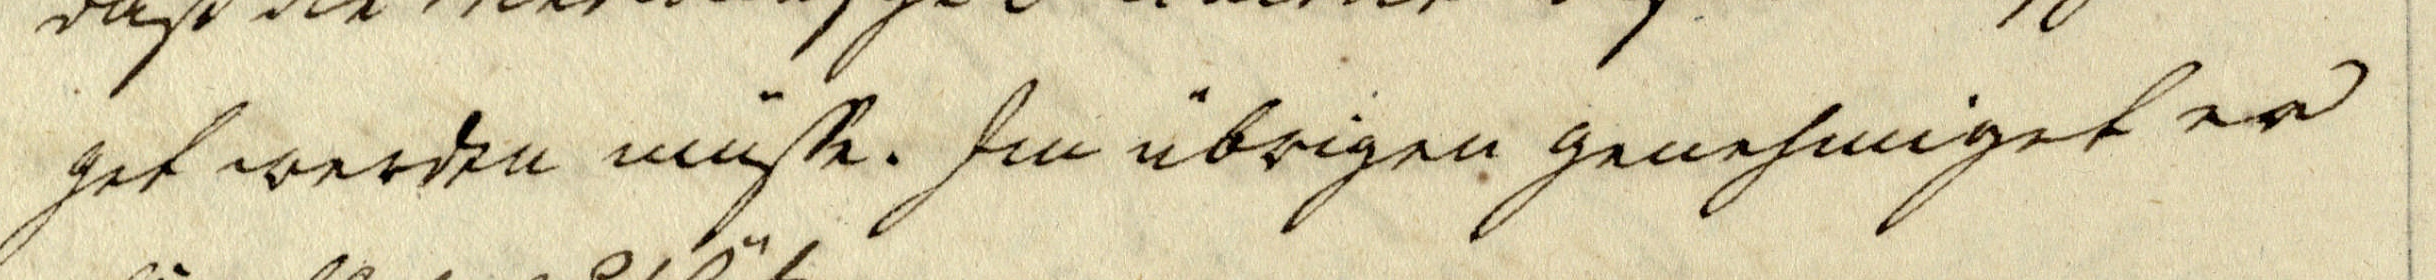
get werden müsse. Im übrigen genehmiget er
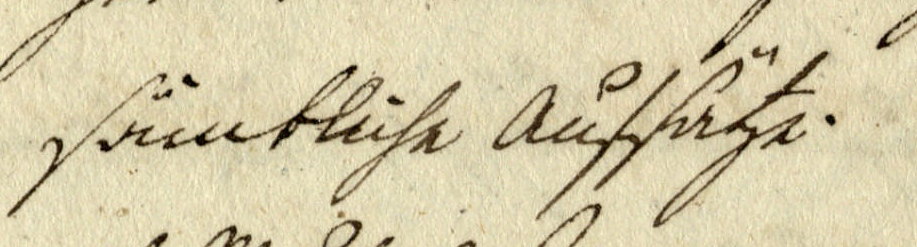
sämtliche Aufsätze.
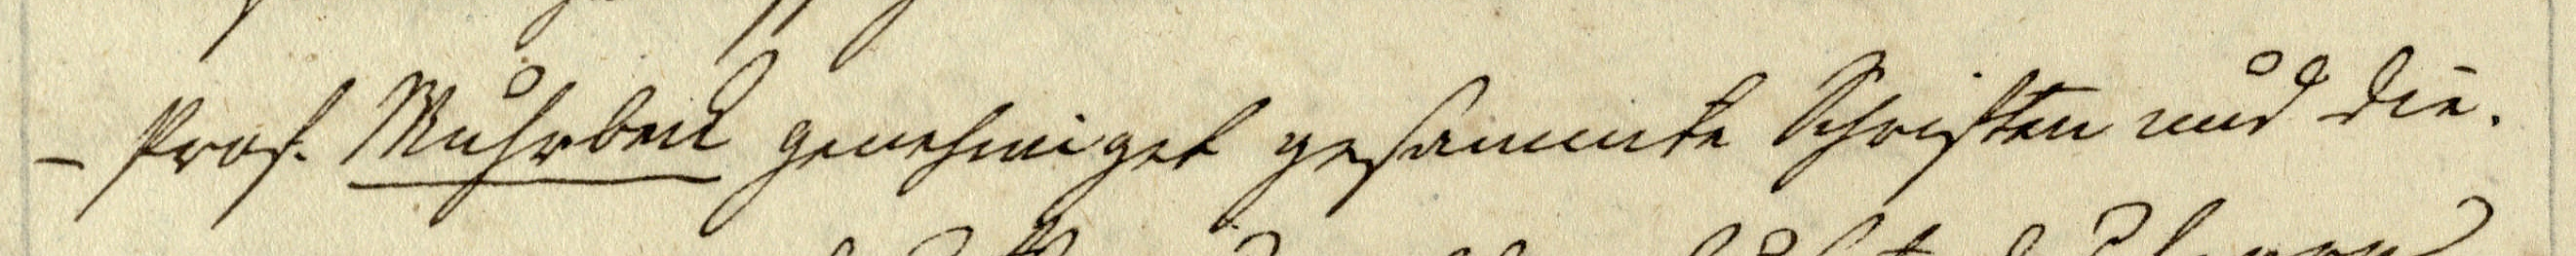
Prof. Muhrbeck genehmiget gesammte Schriften und die¬
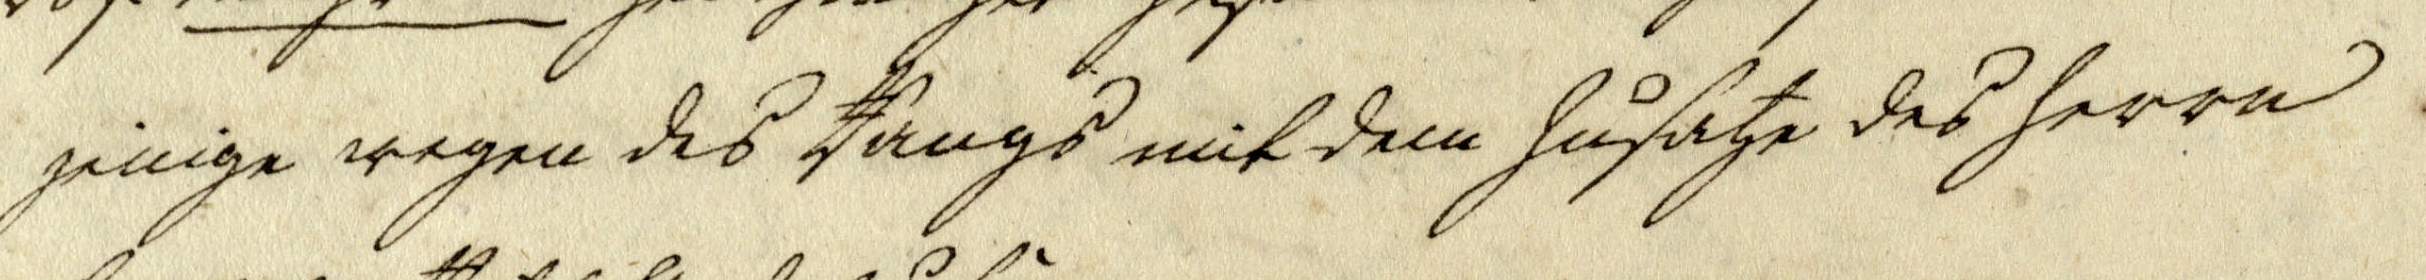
jenige wegen des Rangs mit dem Zusatze des Herrn
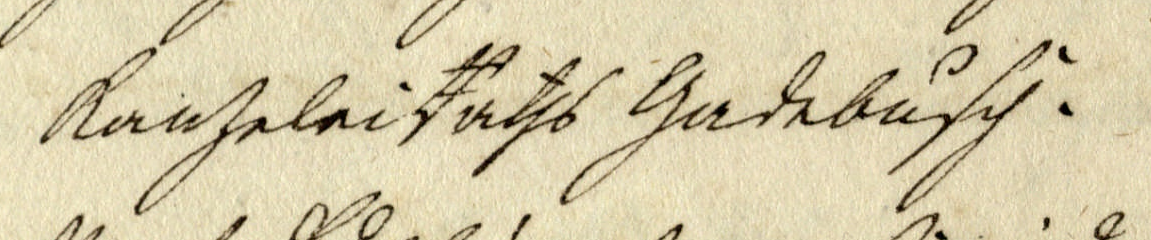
Kanzelei Raths Gadebusch.
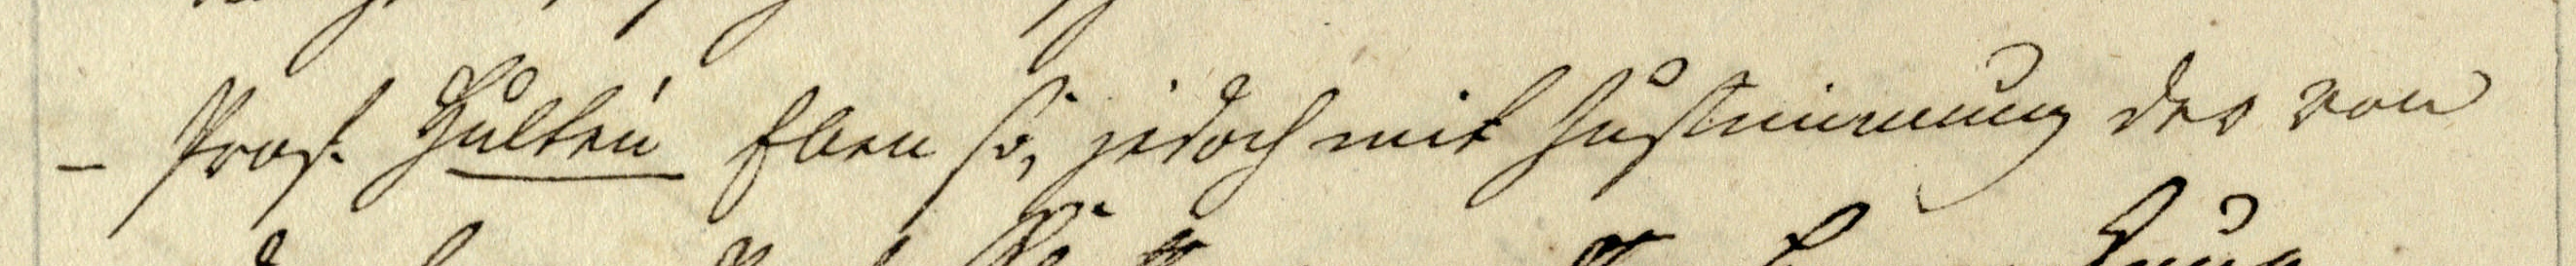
Prof. Hultén Eben so, jedoch mit Zustimmung der von
